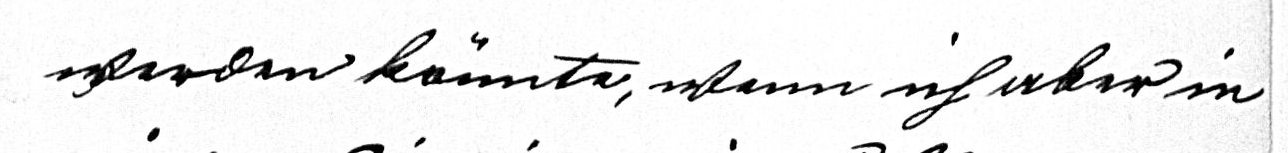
werden könnte, wenn ich aber in
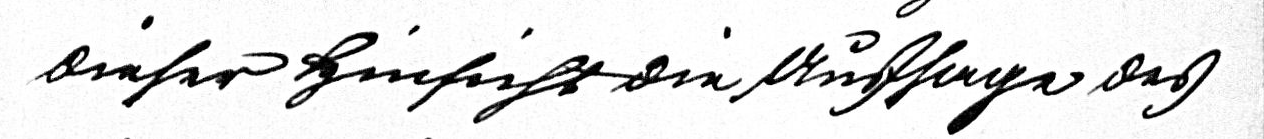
dieser Hinsicht die Aussage des
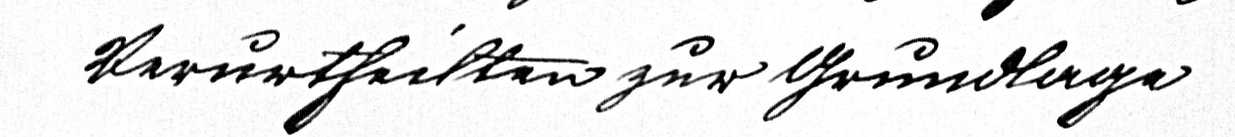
Verurtheilten zur Grundlage
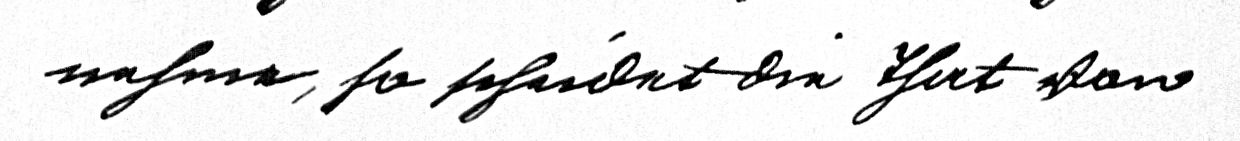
nehme, so scheidet die That von
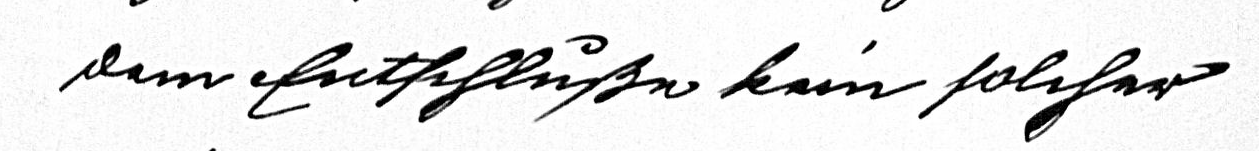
dem Entschluße kein solcher
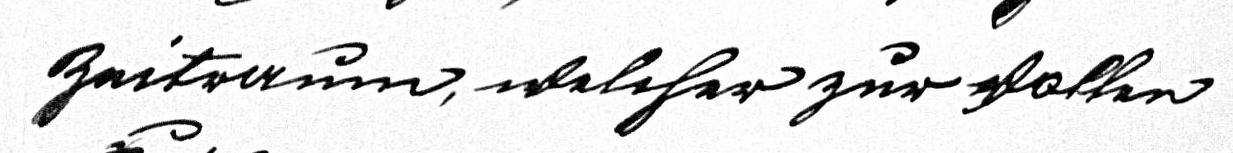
Zeitraum, welcher zur wollen
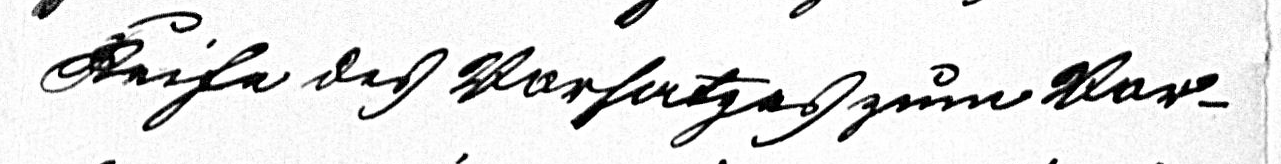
Reife des Vorsatzes zum Vor¬
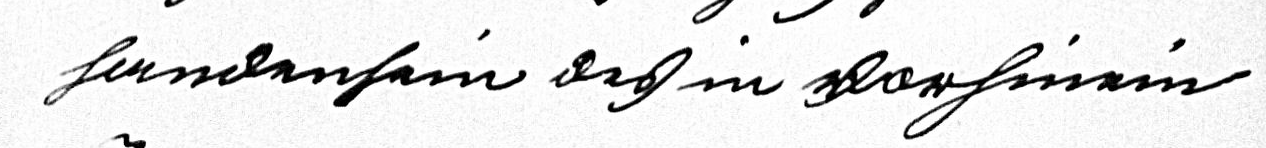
handensein des in vorhinein
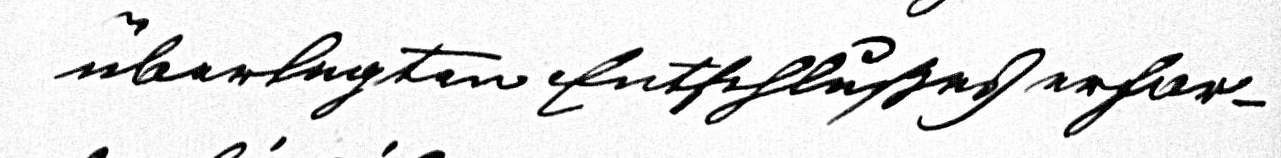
überlegten Entschlußes erfor¬
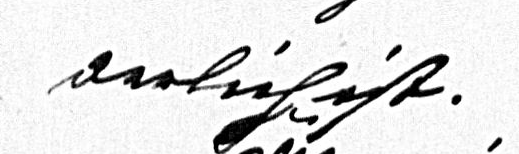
derlich ist.
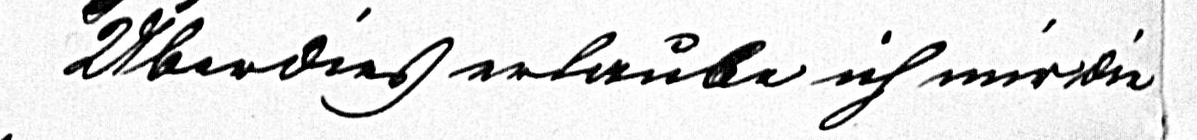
Uberdies erlaube ich mir die
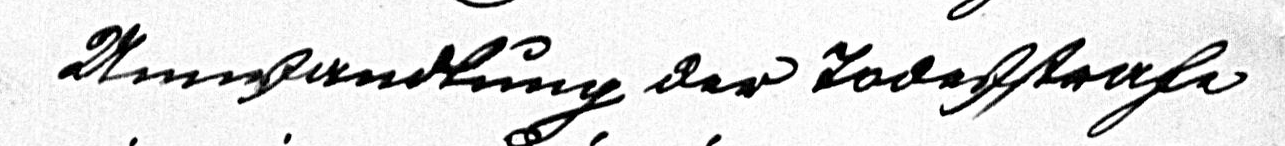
Umwandlung der Todesstrafe
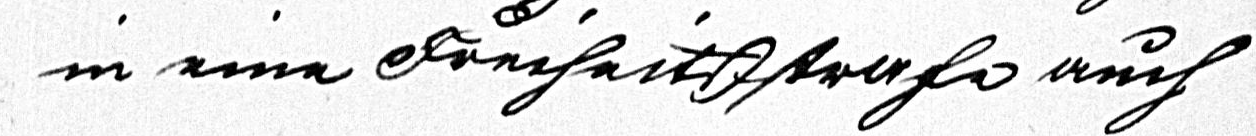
in eine Freiheitsstrafe auch
